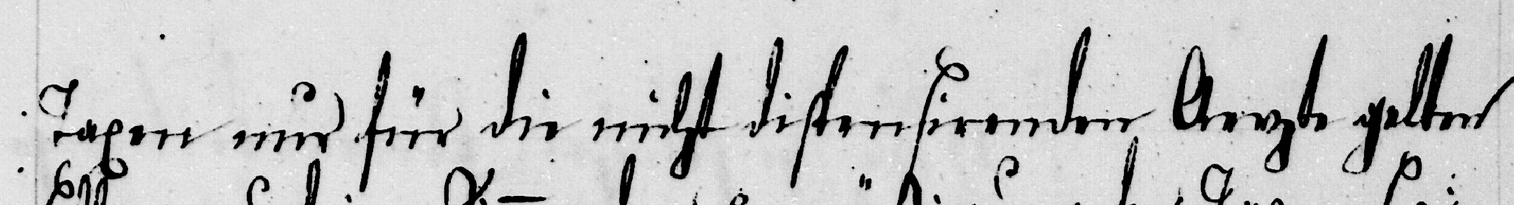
Taxen nur für die nicht dispensirenden Aerzte gelten
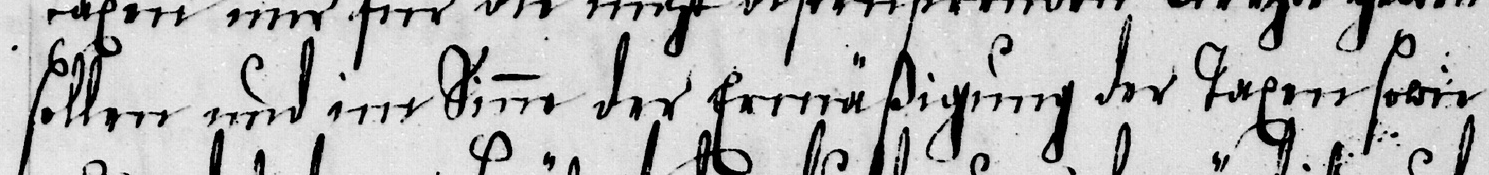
sollen und im Sinne der Ermäßigung der Taxen sowie
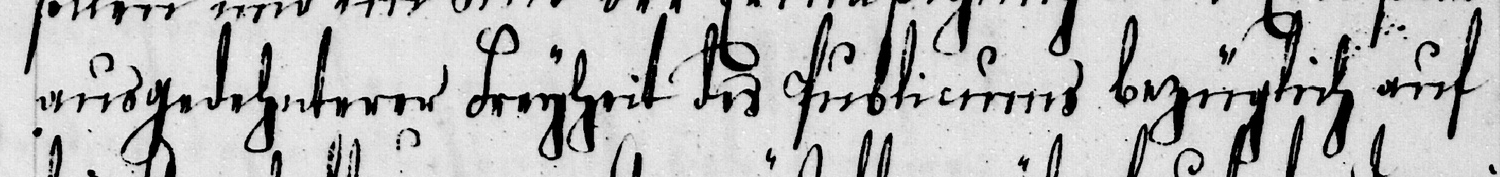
ausgedehnterer Freyheit des Publicums bezüglich auf
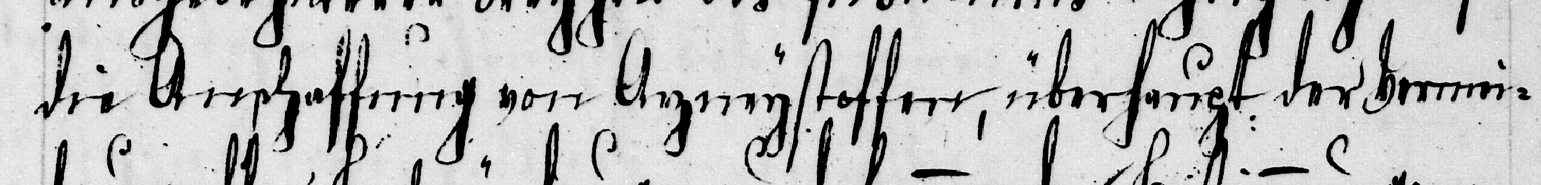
die Anschaffung von Arzneystoffen, überhaupt der Vermei¬
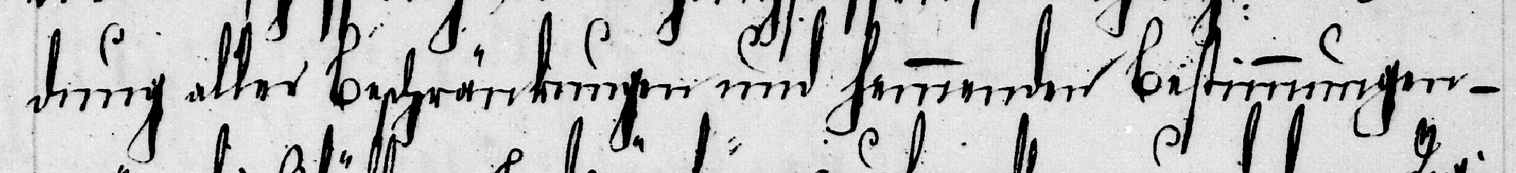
dung aller Beschränkungen und hemmenden Bestimmungen –
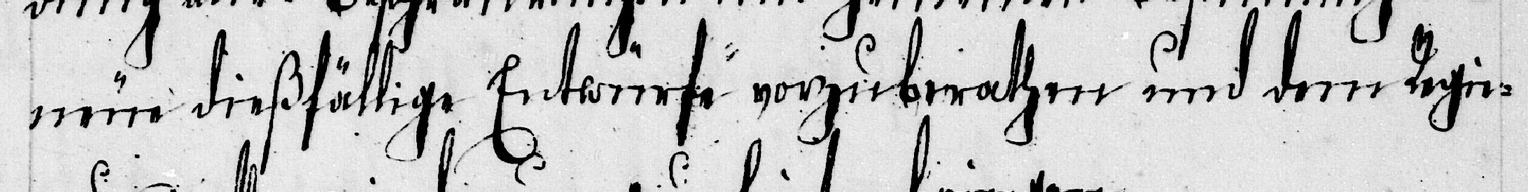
neue dießfälige Entwürfe vorzuberathen und dem Regie¬
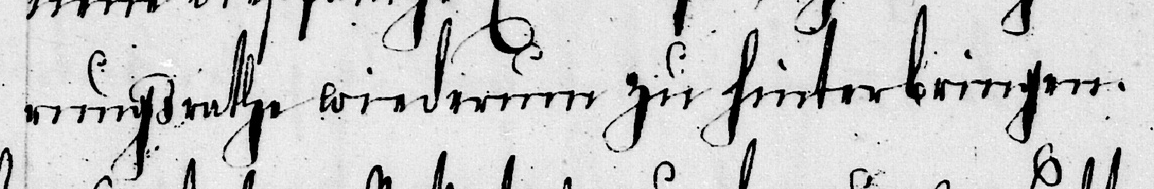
rungsrathe wiederum zu hinterbringen.
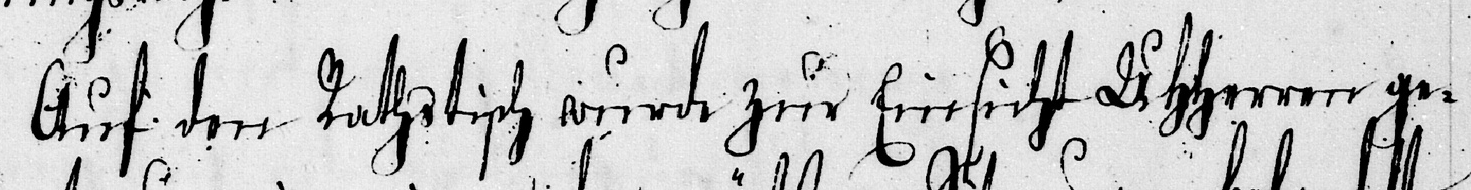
Auf den Rathstisch wurde zur Einsicht UHHerren ge¬
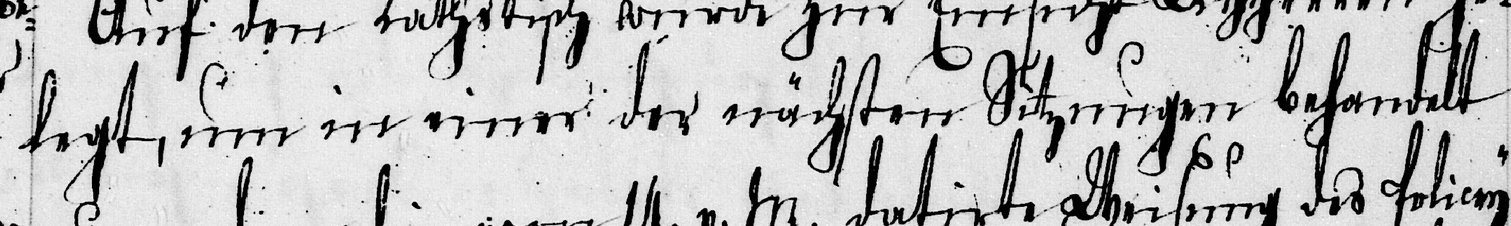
legt, um in einer der nächsten Sitzungen behandelt
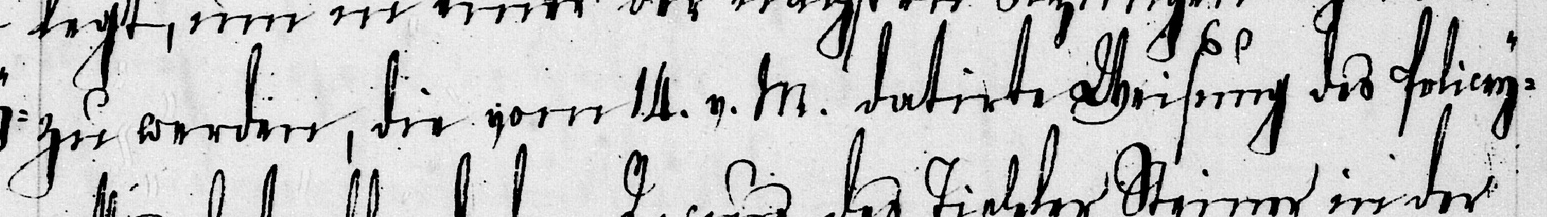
zu werden, die vom 14. v. M. datirte Weisung des Policey¬
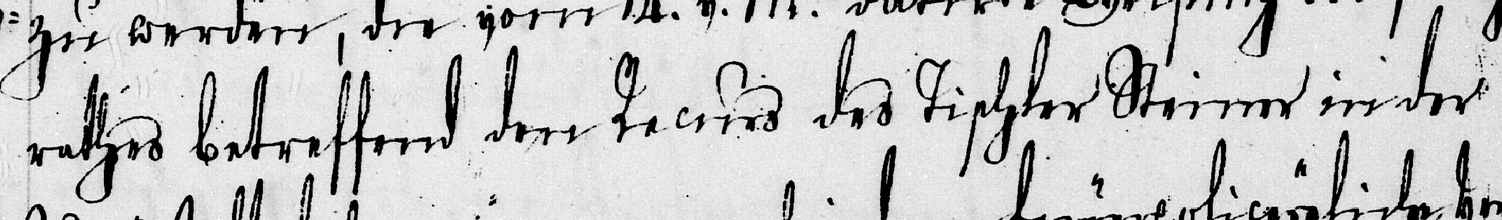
rathes betreffend den Recurs des Tischler Steiner in der
